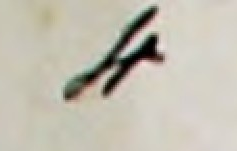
4
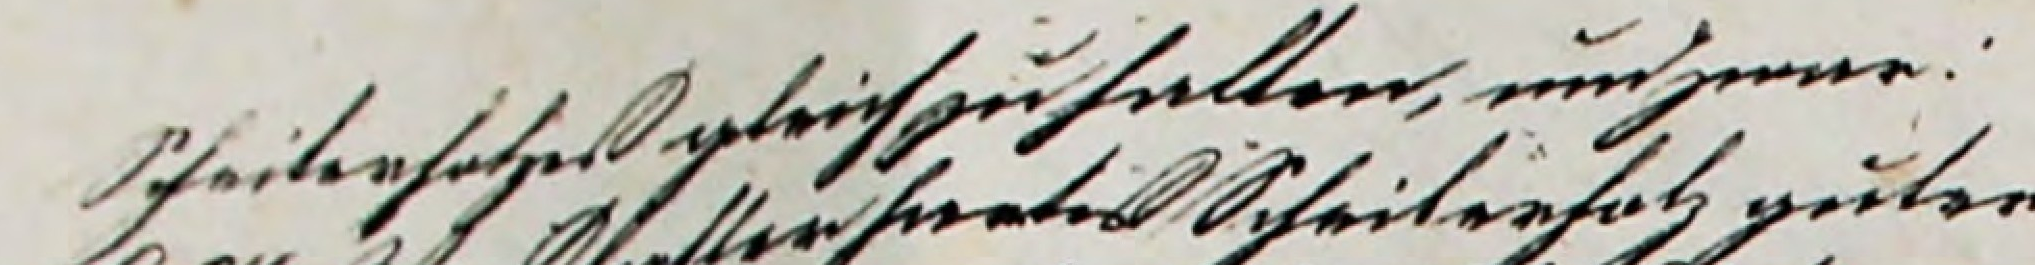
Scheiterholzes gleich zu halten, und zwar.
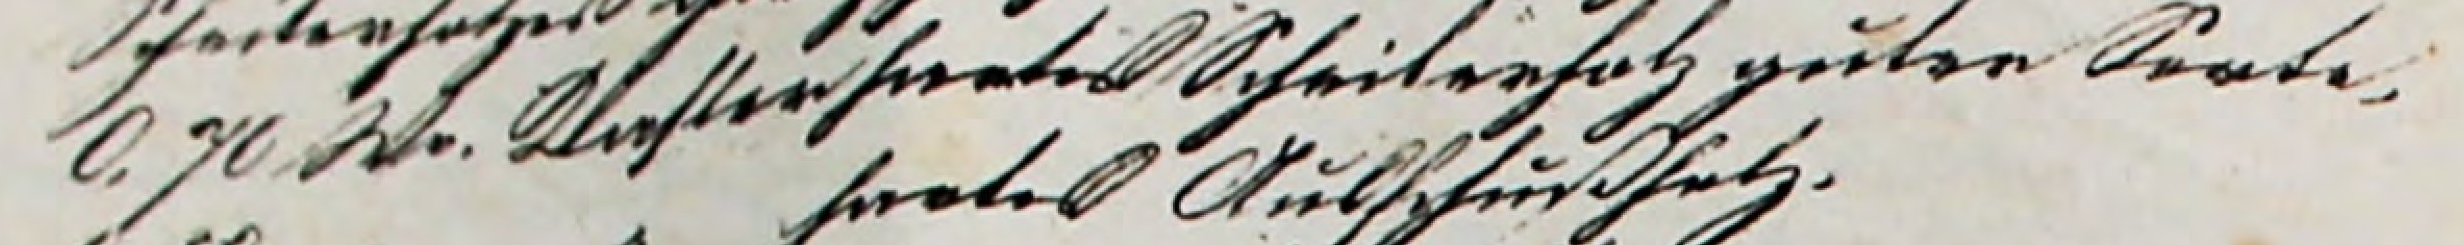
0,70 Wo. Klaster hartes Scheiterholz guter Sorte,
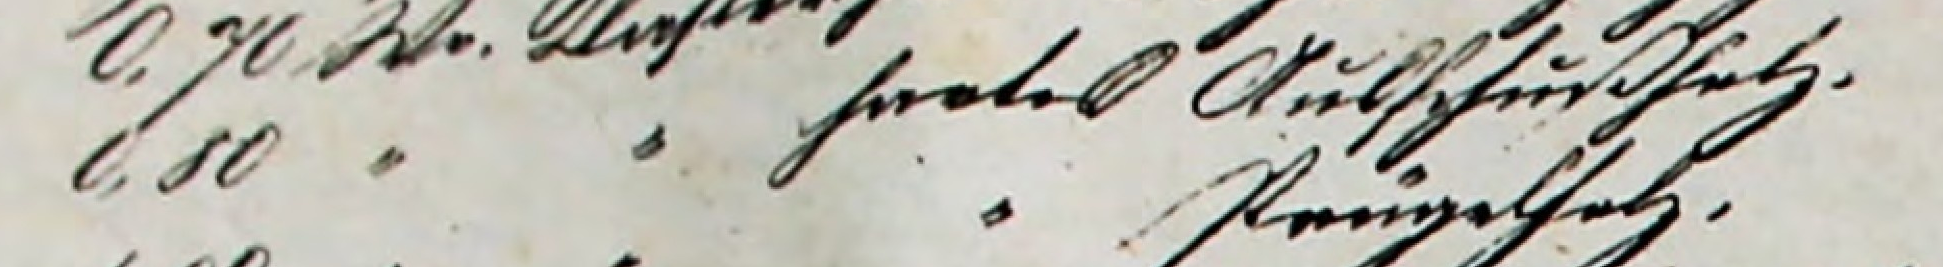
0,80 „ „ hartes Ausschußholz,
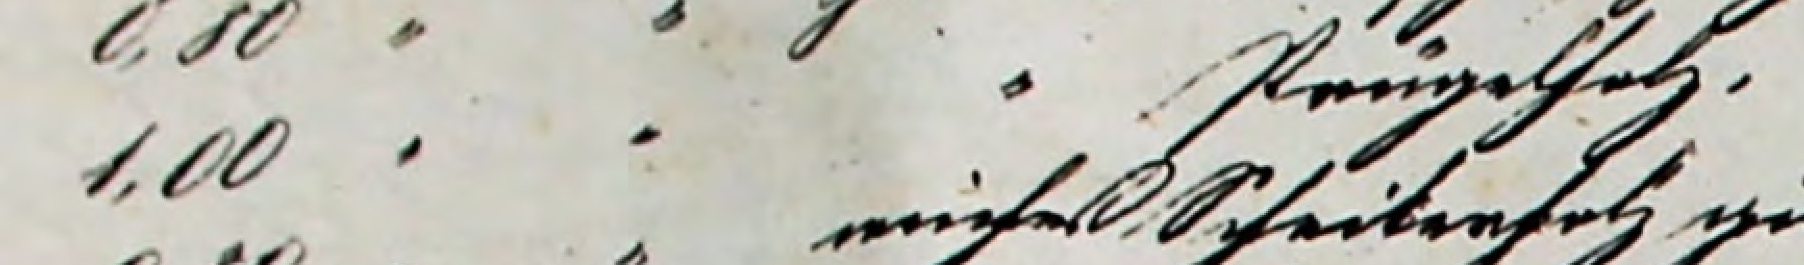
1,00 „ „ „ Prügelholz,
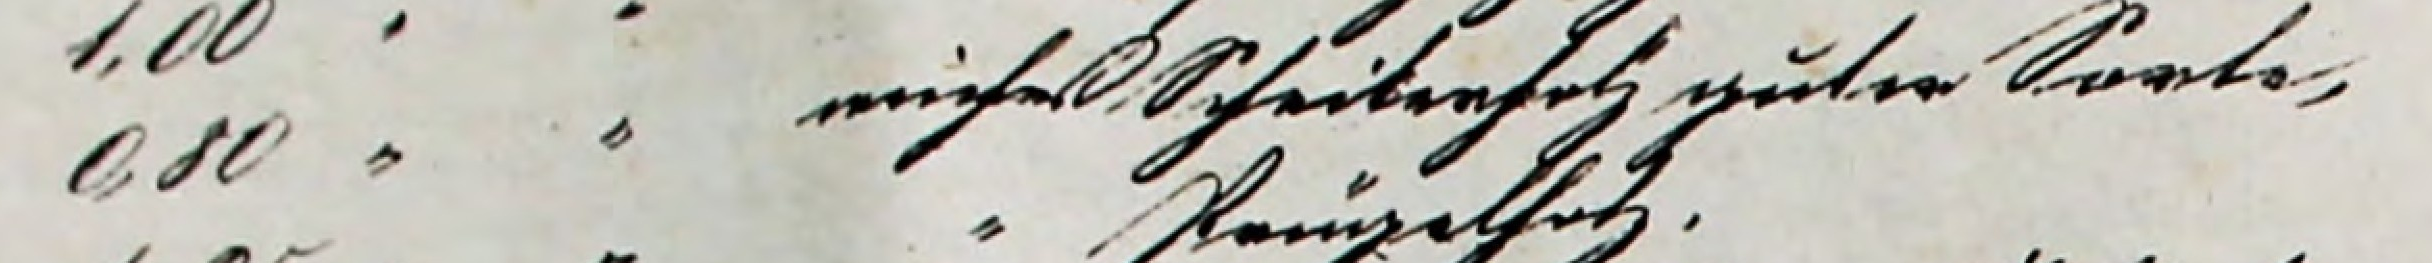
0,80 „ „ weiches Scheiterholz guter Sorte,
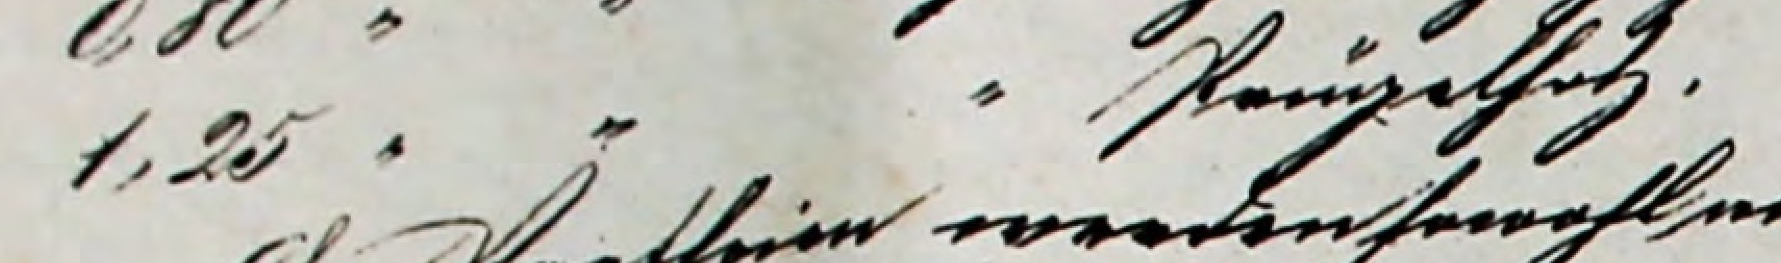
1,25 „ „ „ Prügelholz.
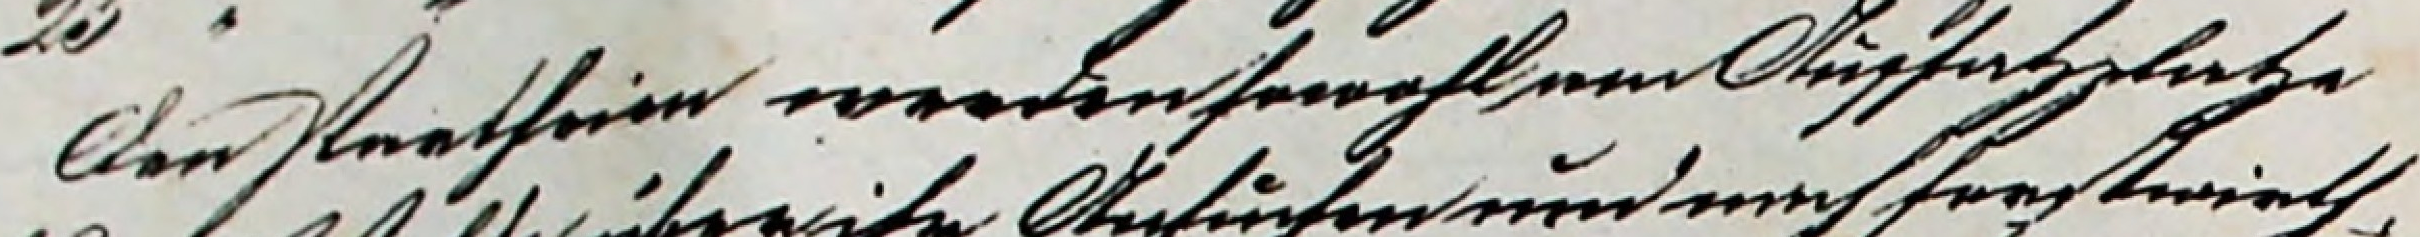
Den Partheien werden sowohl am Aufsatzglatze
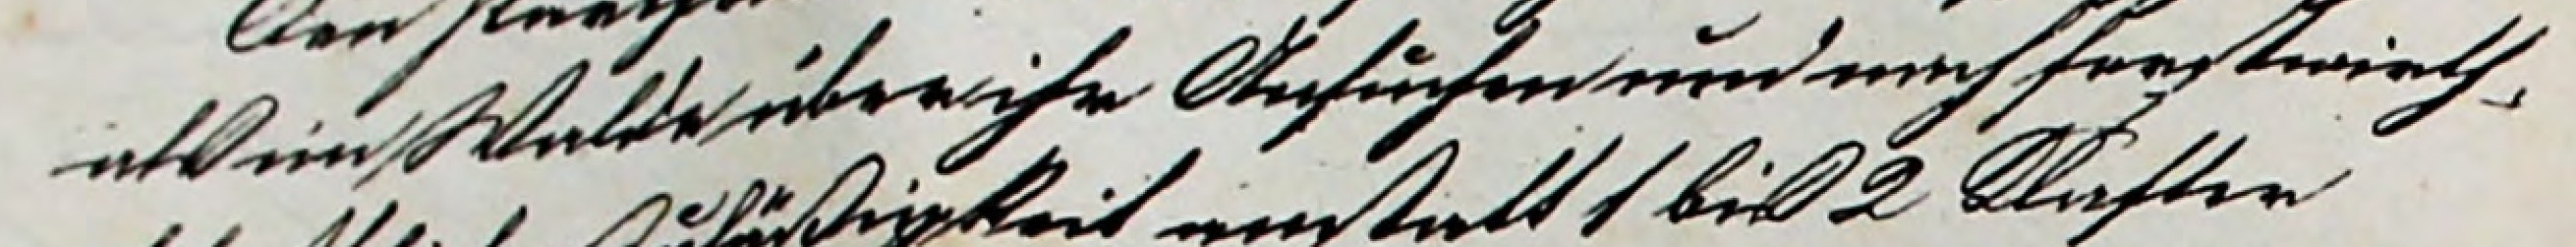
als im Walde über ihr Ansuchen und nach forstwirth„
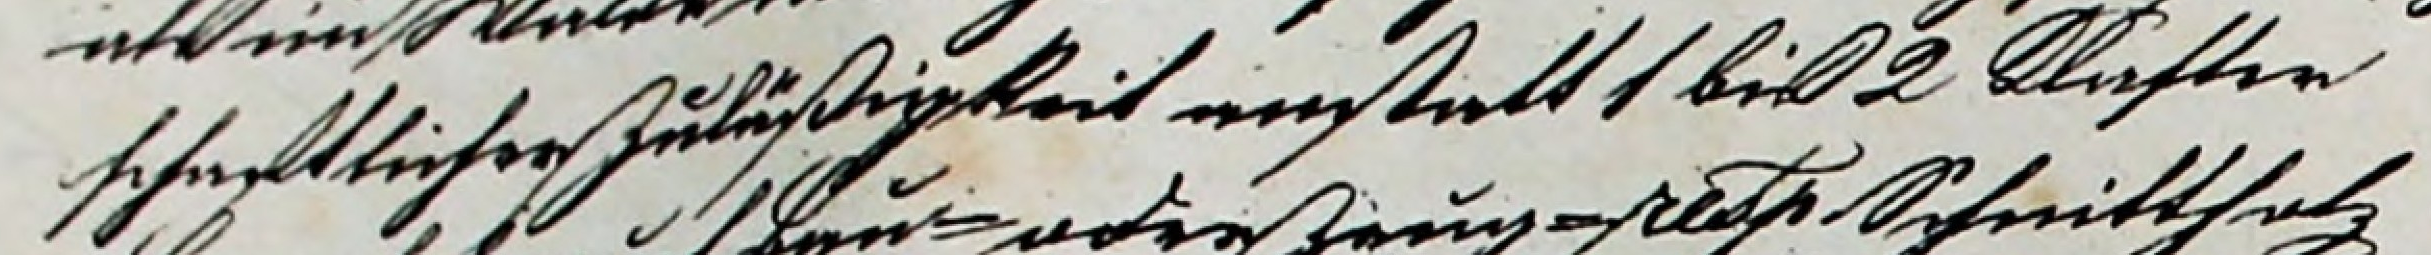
schaftlicher Zuläßigkeit anstatt 1 bis 2 Klaster
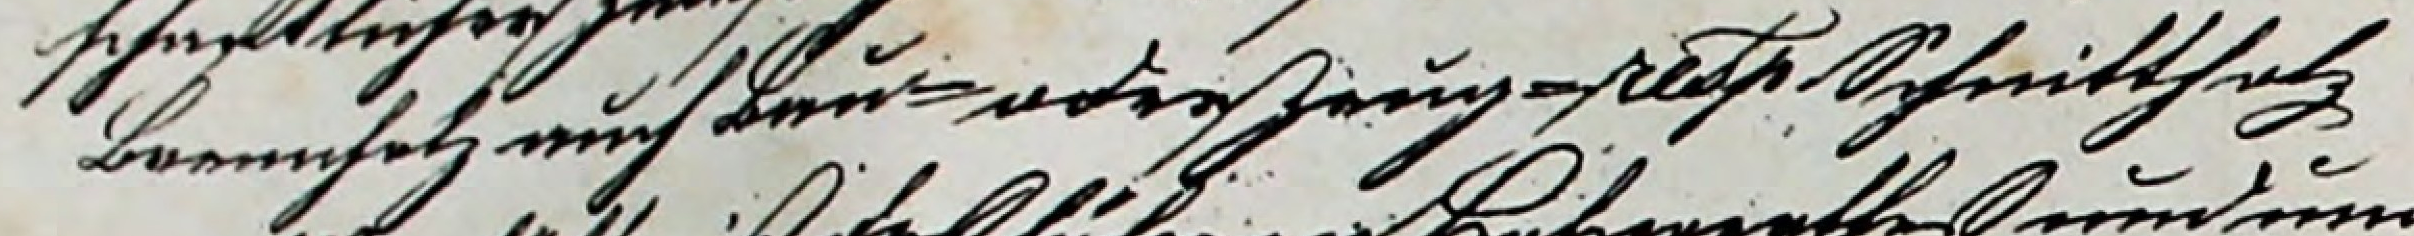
Brennholz auch Bau in oder Zeug = resp Schnittholz
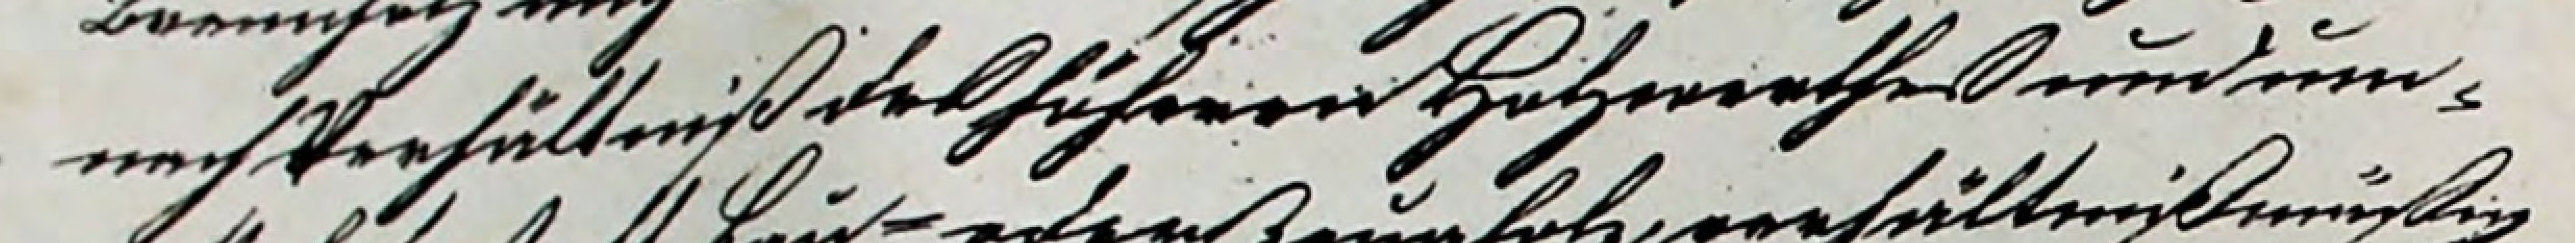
nach Verhältniß des höheren Holzwerthes und um„
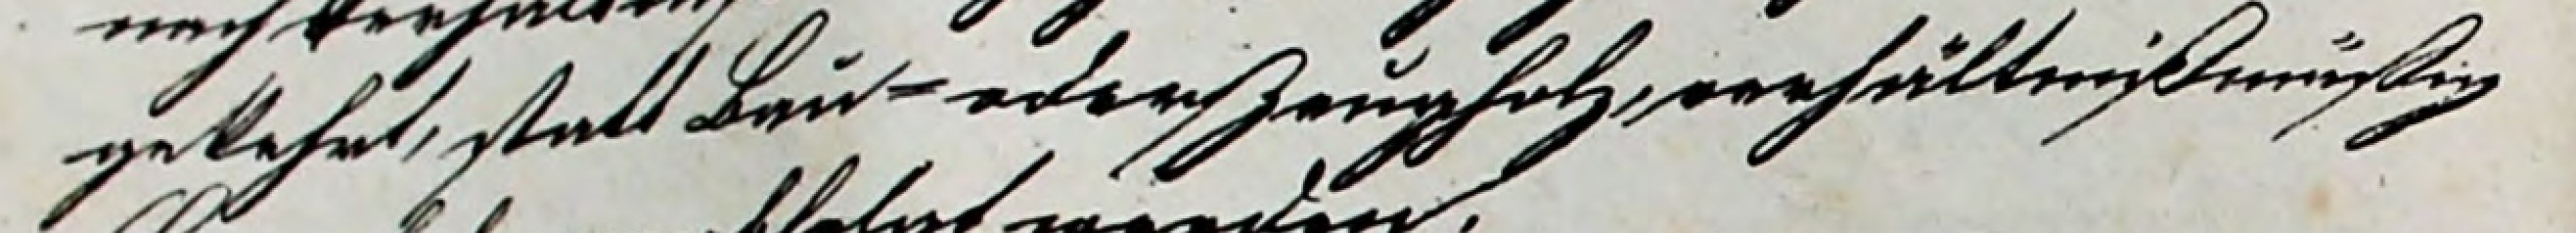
gekehrt, statt Bau= oder Zeugholz, verhältnißmüßig
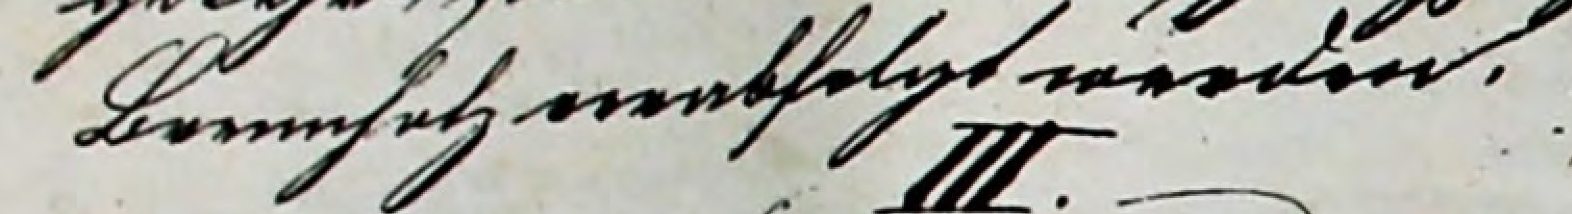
Brennholz verabfolgt werden.
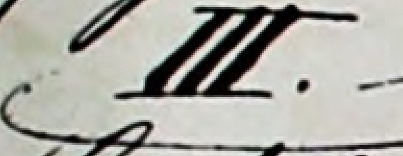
III.
